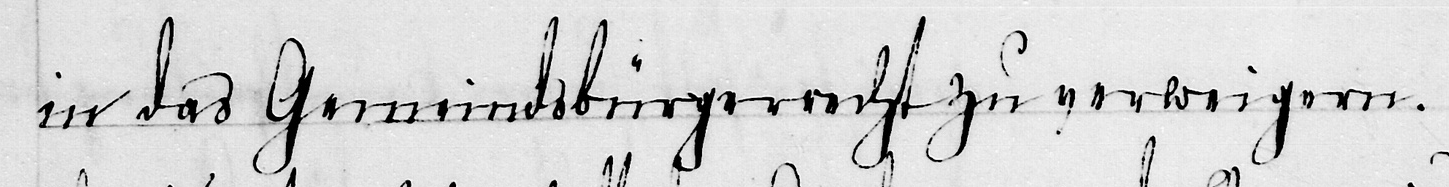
in das Gemeindsbürgerrecht zu verweigern.
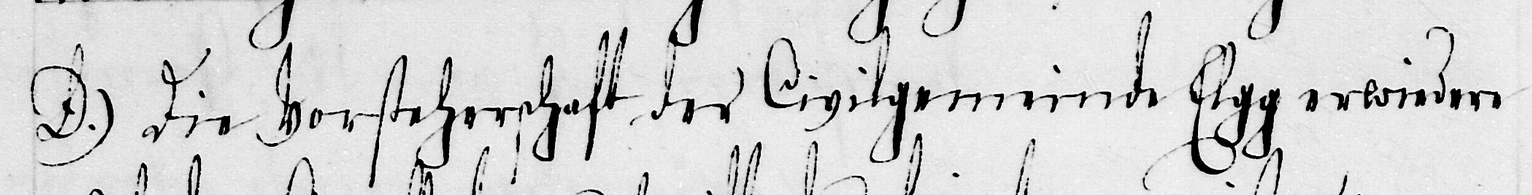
D.) Die Vorsteherschaft der Civilgemeinde Elgg erwiedere
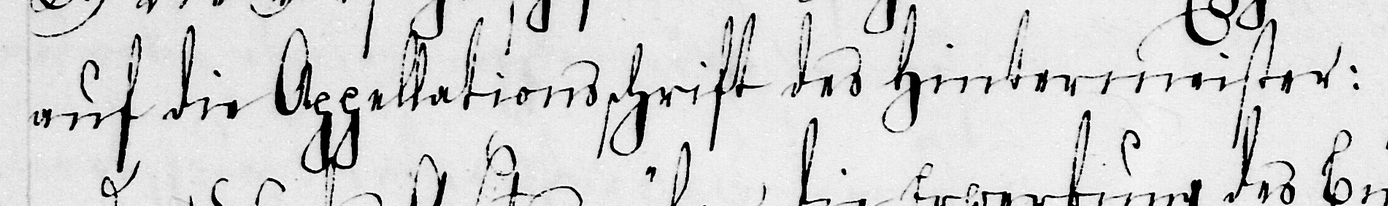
auf die Appellationsschrift des Hintermeister:
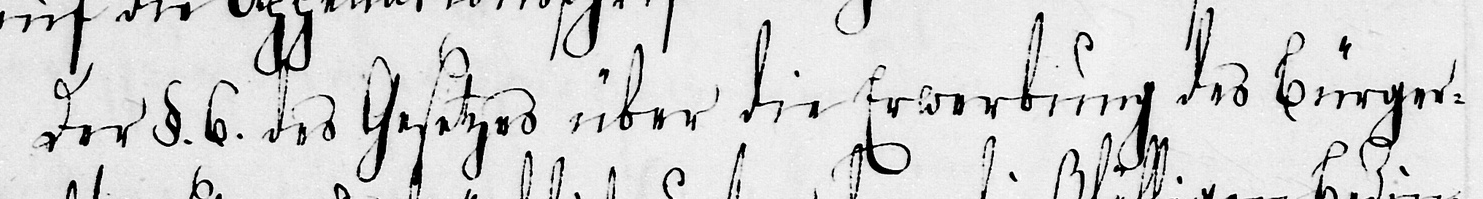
Der §. 6. des Gesetzes über die Erwerbung des Bürger¬
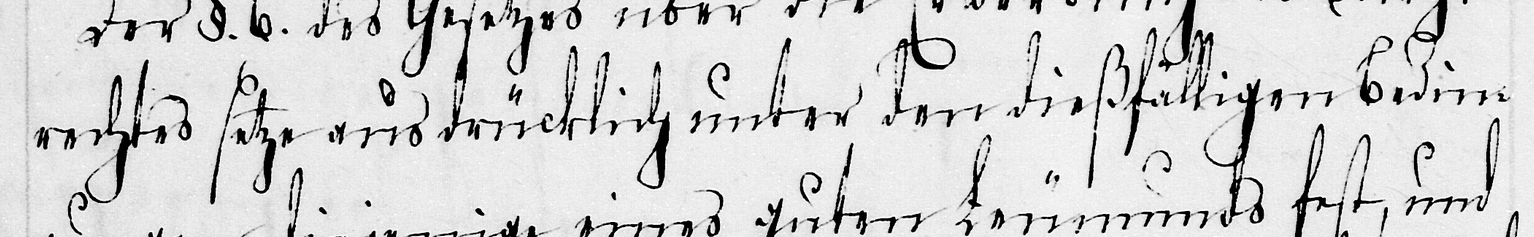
rechtes setze ausdrücklich unter den dießfälligen Bedin¬
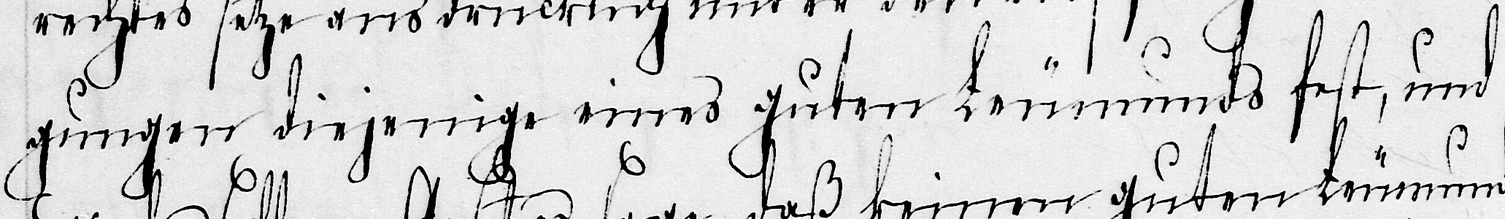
gungen diejenige eines guten Leumunds fest, und
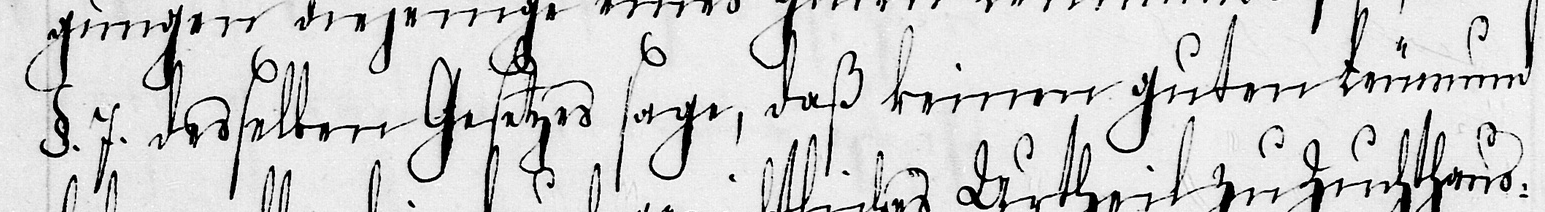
§. 7. desselben Gesetzes sage, daß keinen guten Leumund
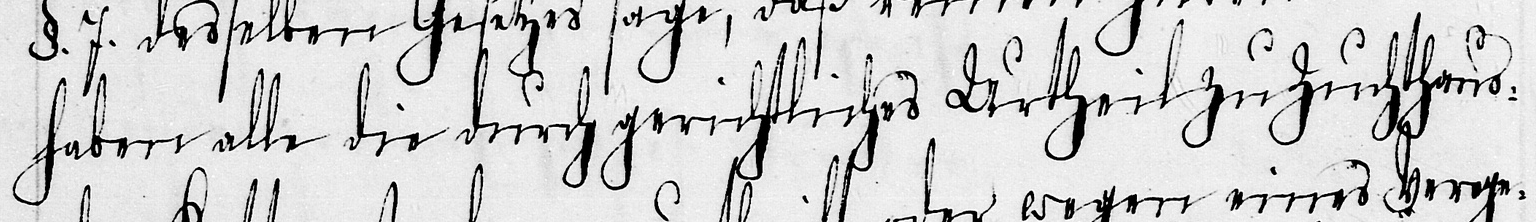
haben alle die durch gerichtliches Urtheil zu Zuchthaus-
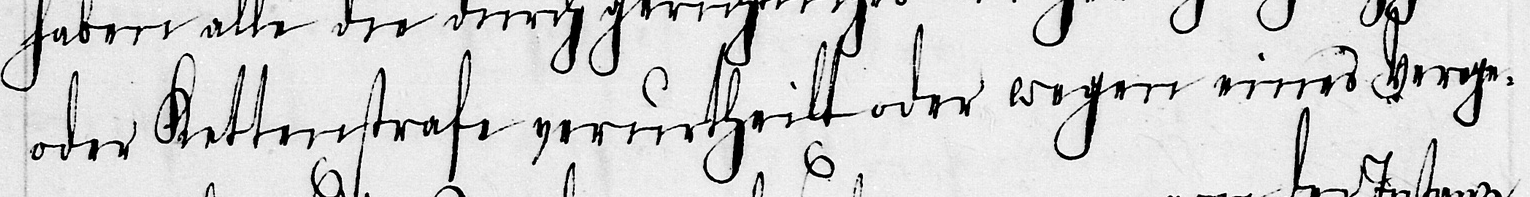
oder Kettenstrafe verurtheilt oder wegen eines Verge¬
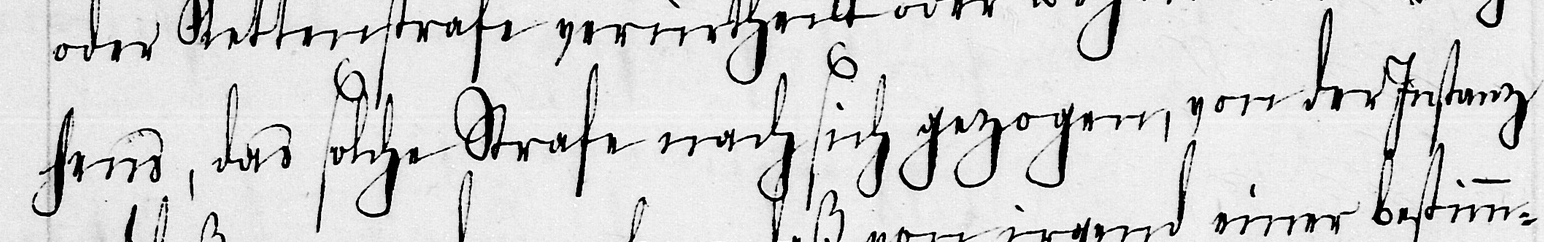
hens, das solche Strafe nach sich gezogen, von der Instanz
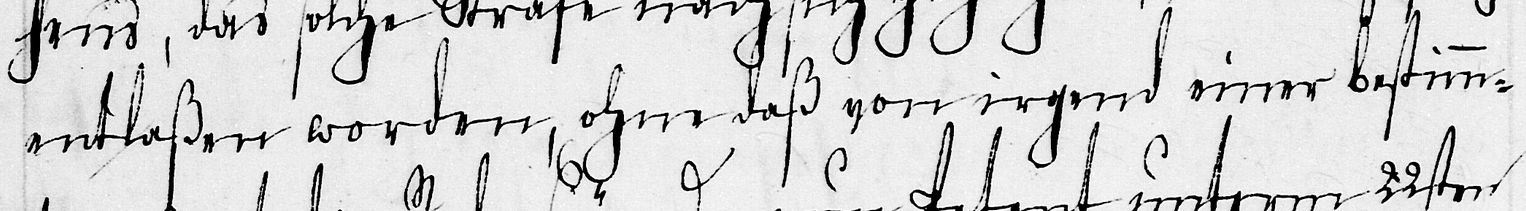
entlaßen worden, ohne daß von irgend einer bestimm¬
